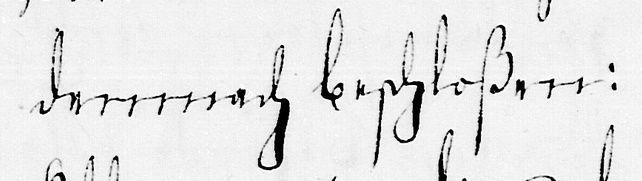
demnach beschloßen:
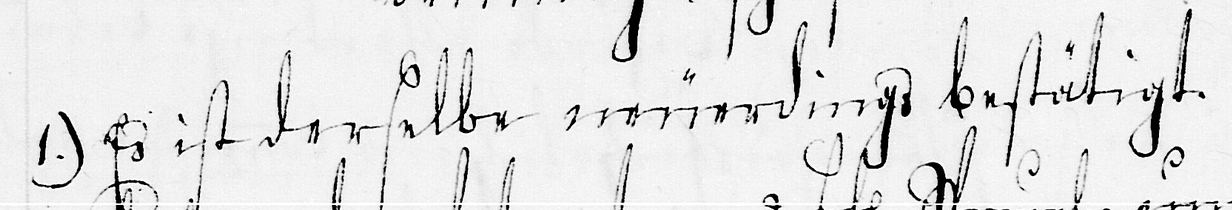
1.) Es ist derselbe neuerdings bestätigt.
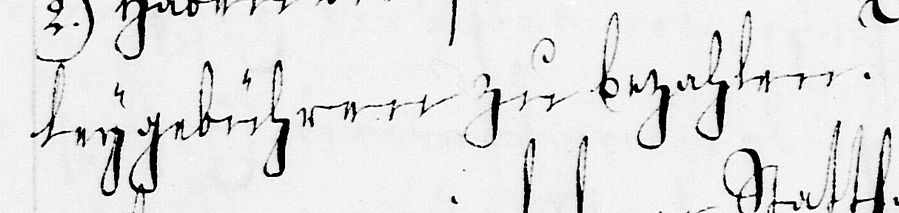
leygebühren zu bezahlen.
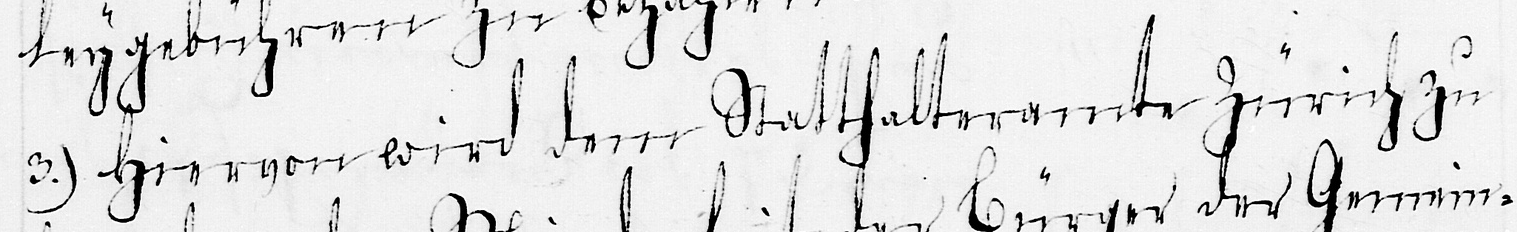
3.) Hiervon wird dem Statthalteramte Zürich zu
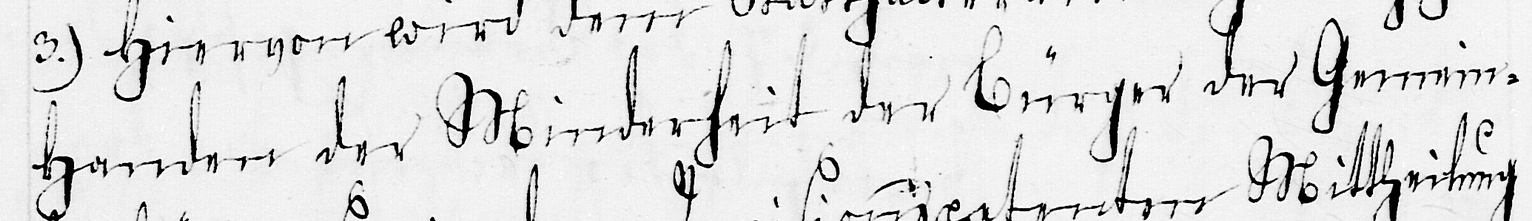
Handen der Minderheit der Bürger der Gemein¬
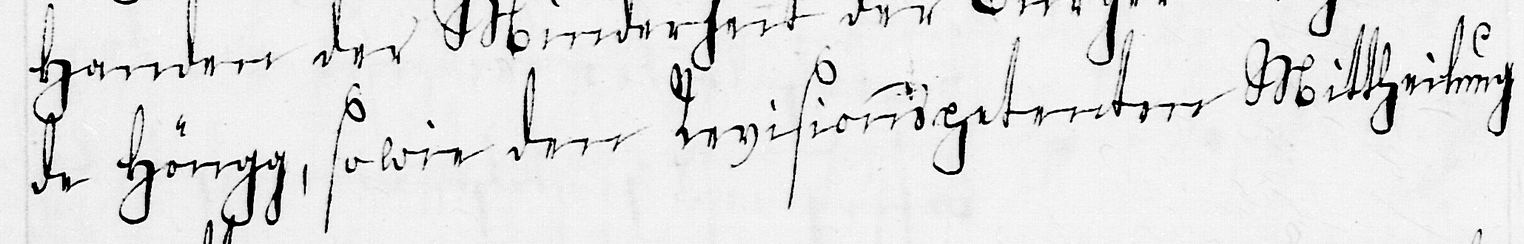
de Höngg, sowie den Revisionspetenten Mittheilung
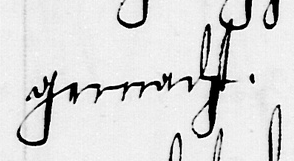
gemacht.
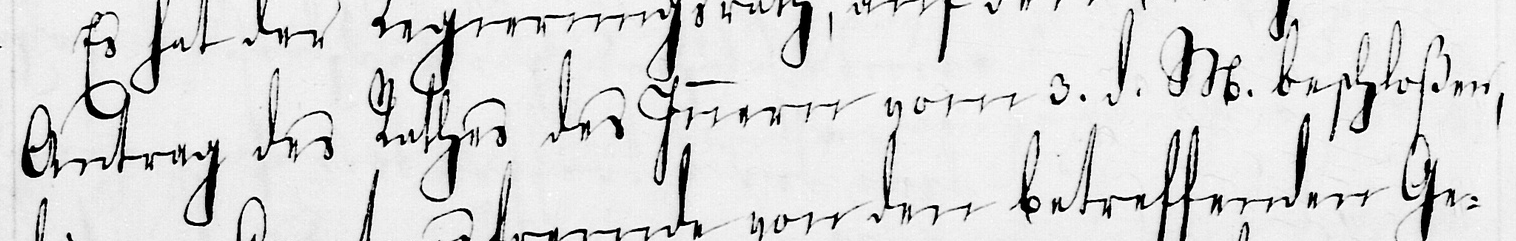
Antrag des Rathes des Innern vom 3. d. M. beschloßen,
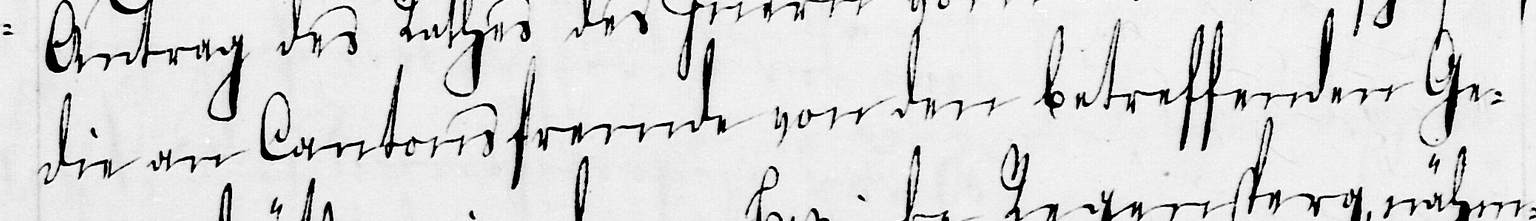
die an Cantonsfremde von den betreffenden Ge¬
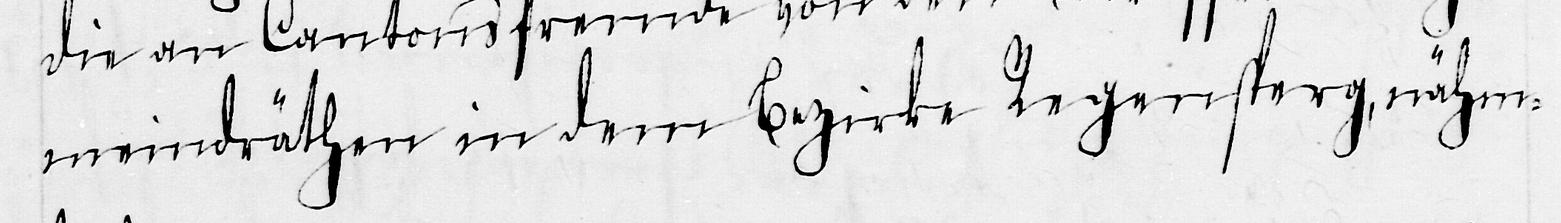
meindräthen in dem Bezirke Regensperg, nähm¬
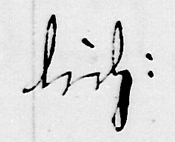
lich:
